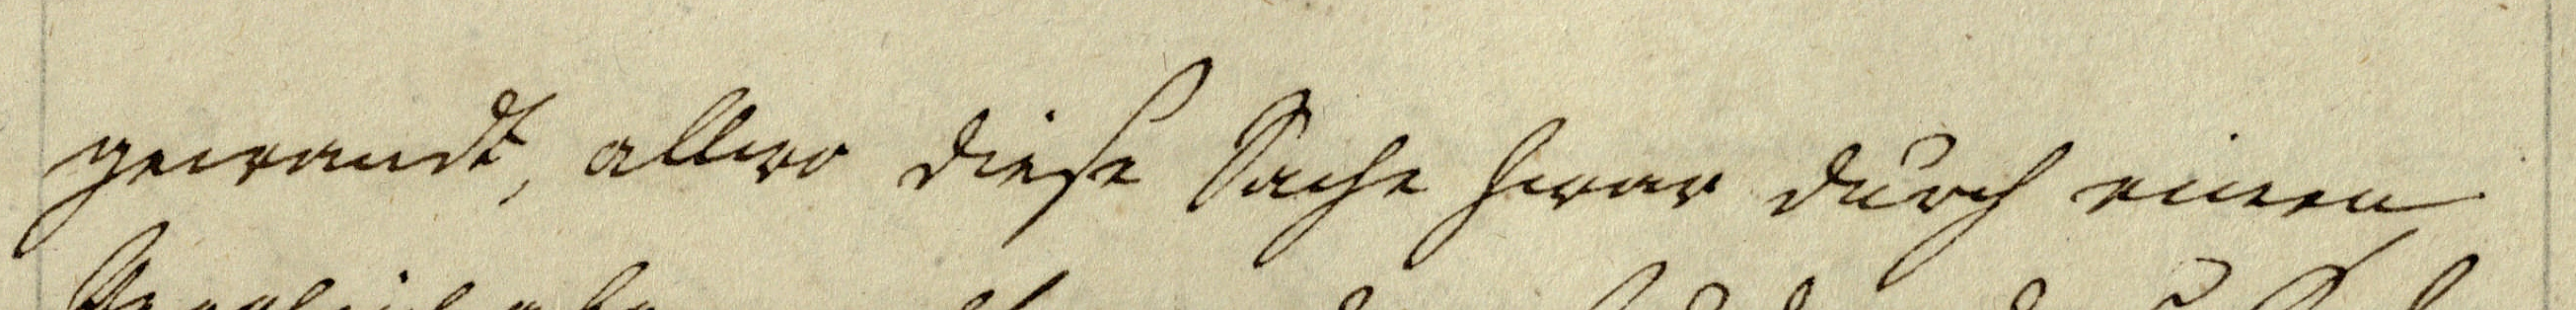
gewandt, allwo diese Sache zwar durch einen
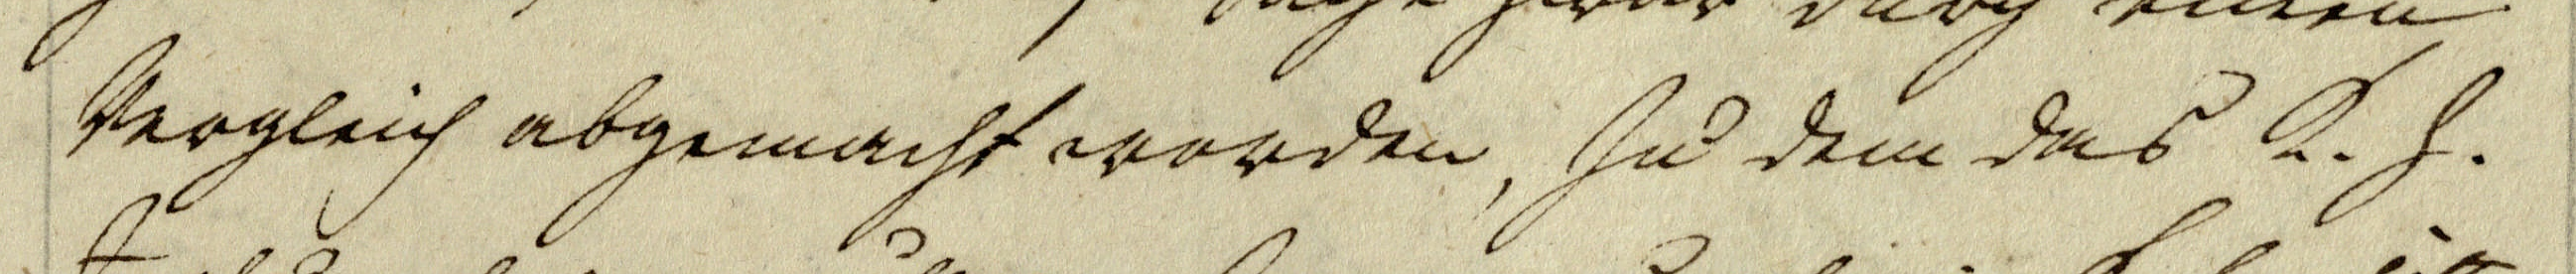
Vergleich abgemacht worden, zu dem das K. h.
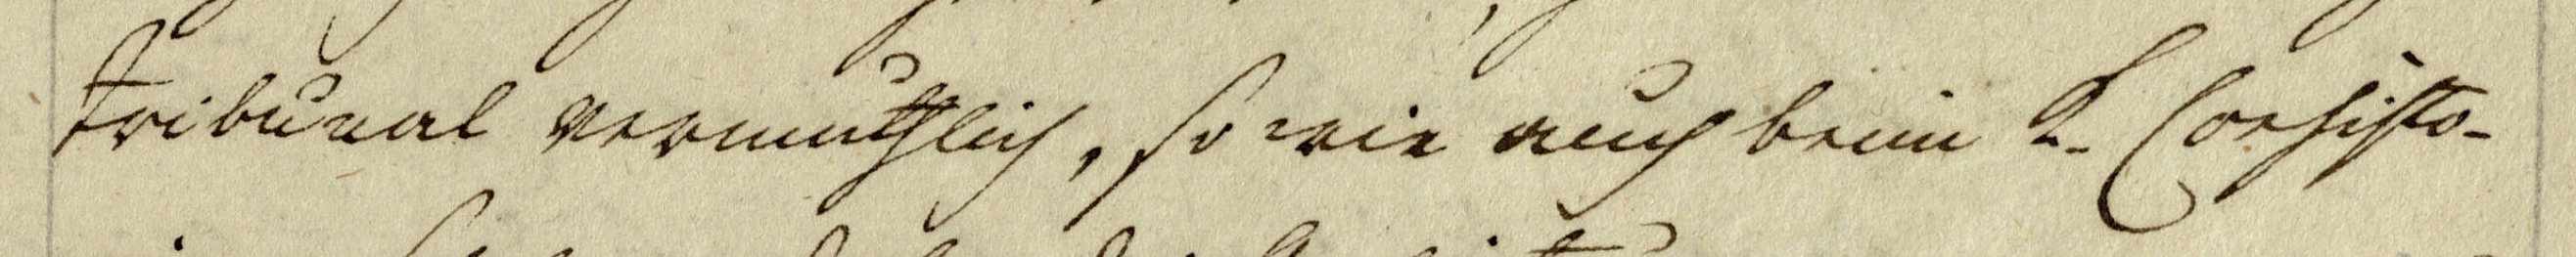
Tribunal vermuthlich, so wie auch beim K. Consisto¬
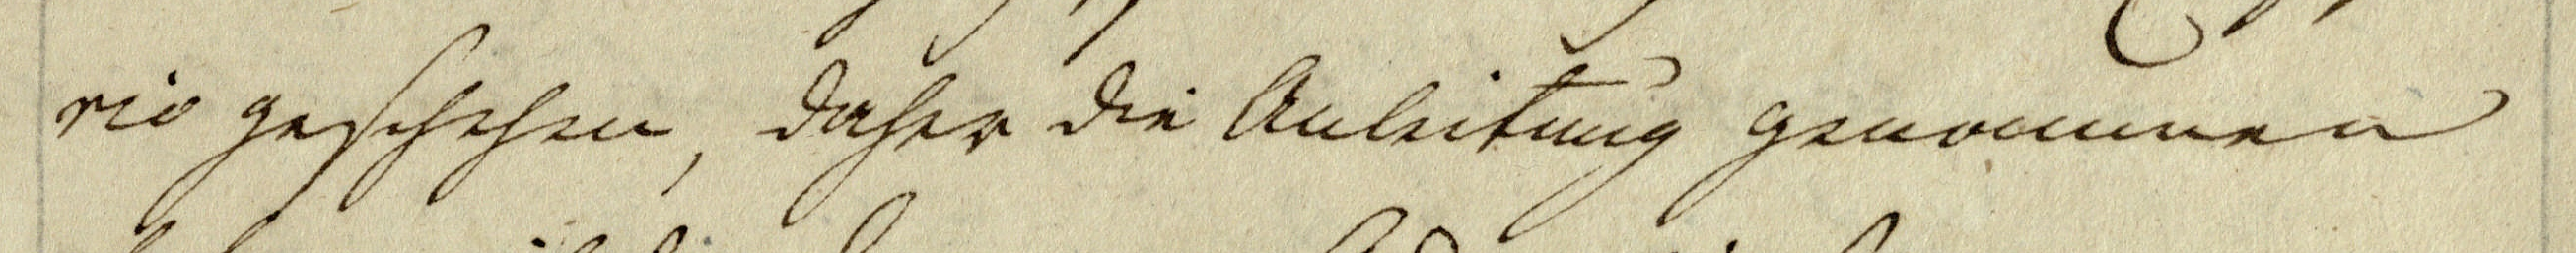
rio geschehen, daher die Anleitung genommen
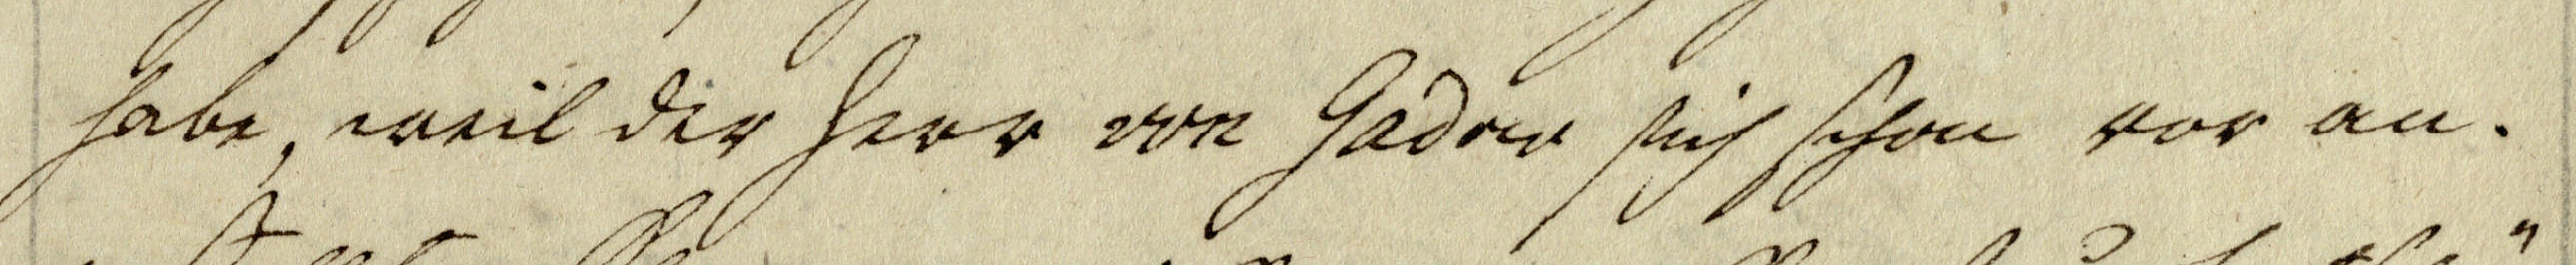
habe, weil der Herr von Gadow sich schon vor an¬
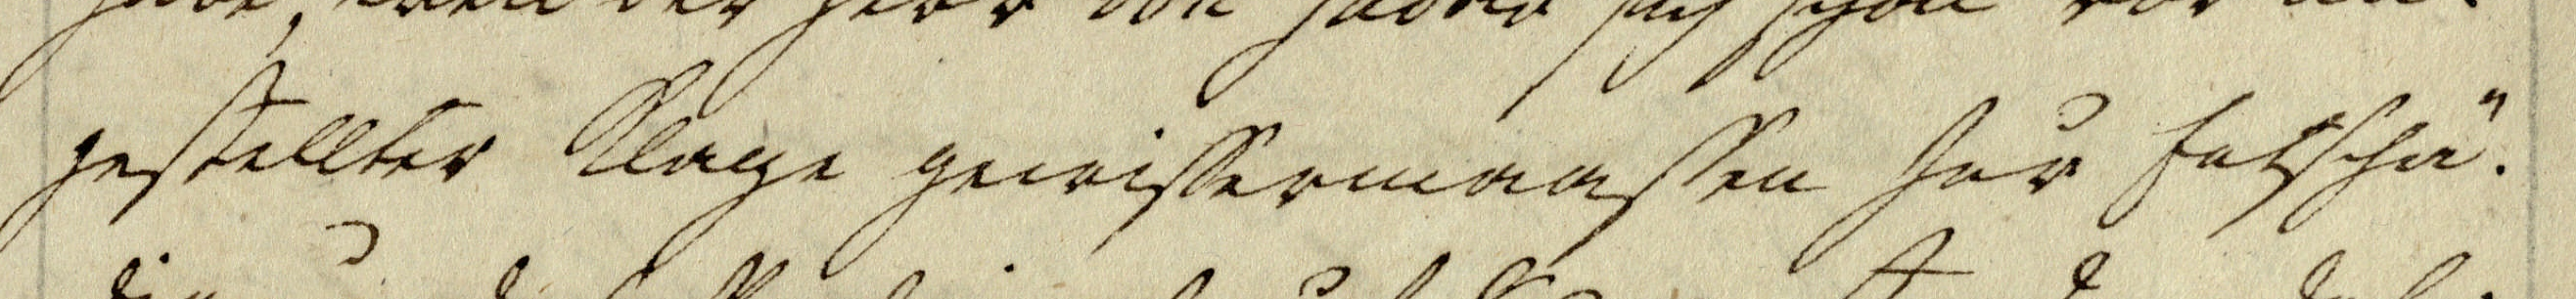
gestellter Klage gewissermaassen zur Entschä¬
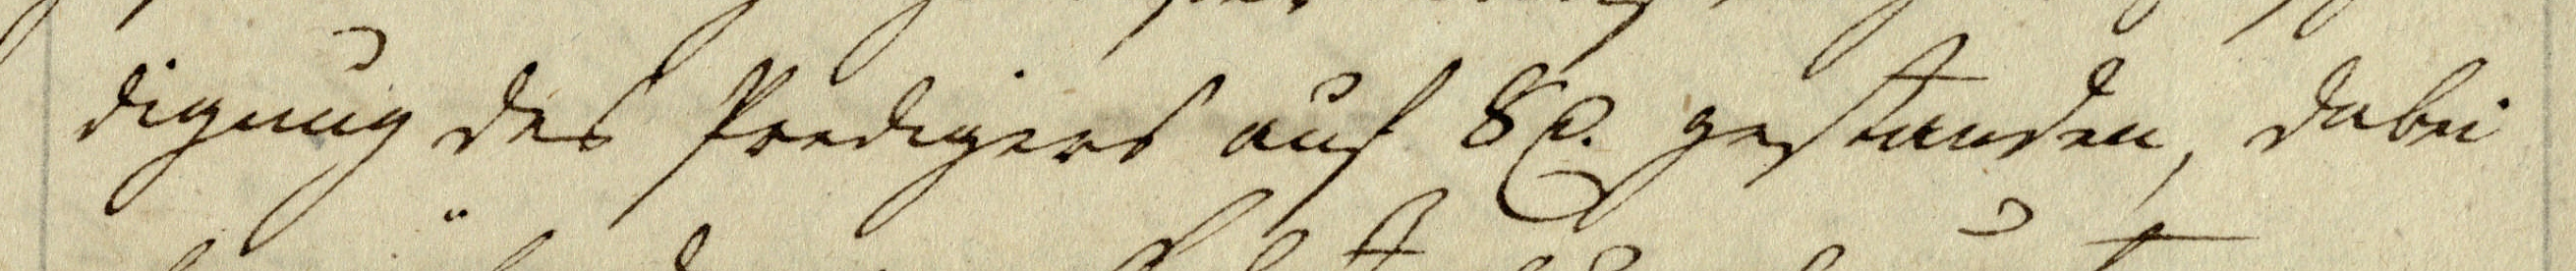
digung des Predigers auf 8 l. gestanden, dabei
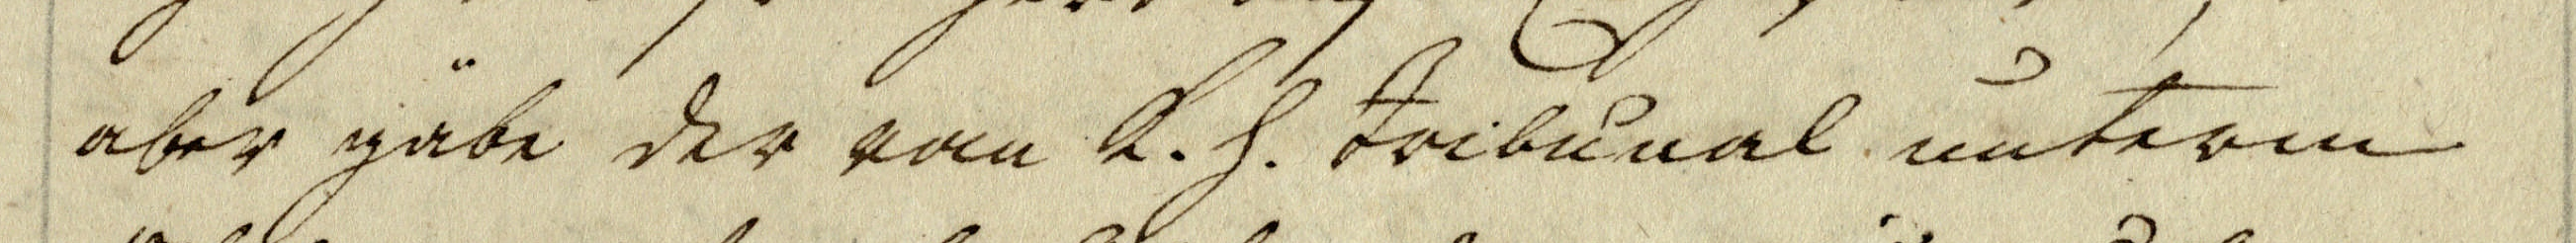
aber gäbe der vom K. H. Tribunal unterm
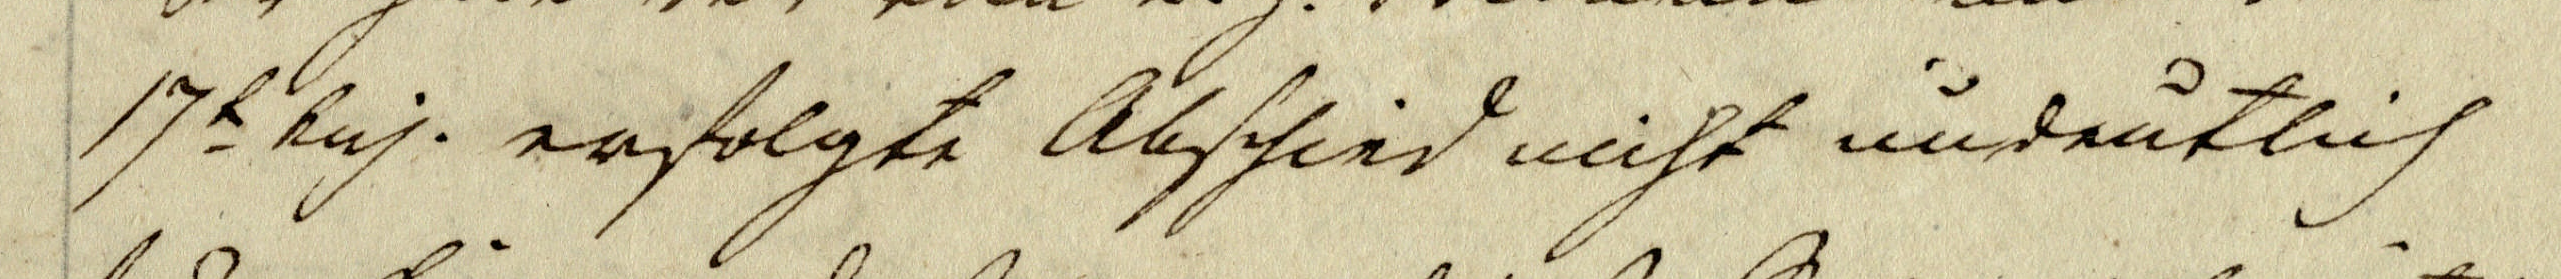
17 te huj. erfolgte Abschied nicht undeutlich
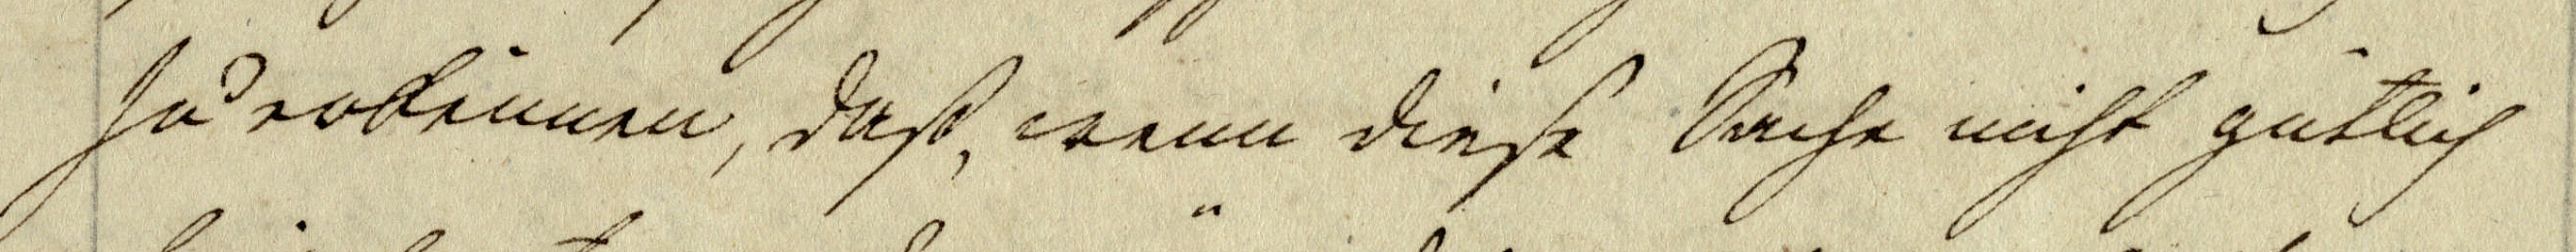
zu erkennen, daß wenn diese Sache nicht gütlich
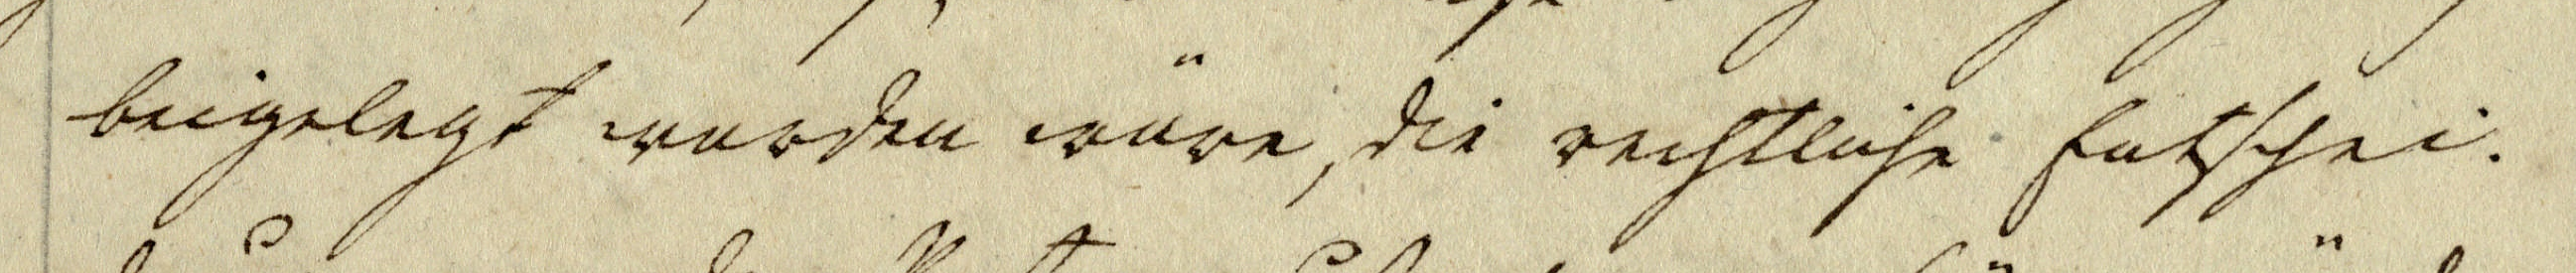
beigelegt worden wäre, die rechtliche Entschei¬
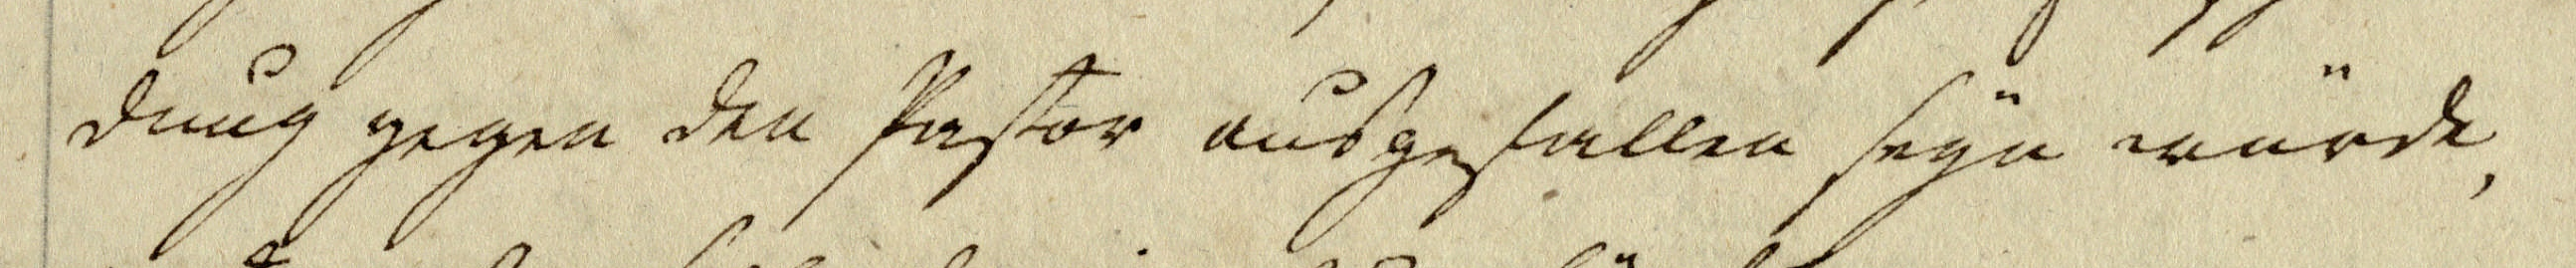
dung gegen den Pastor ausgefallen seÿn würde,
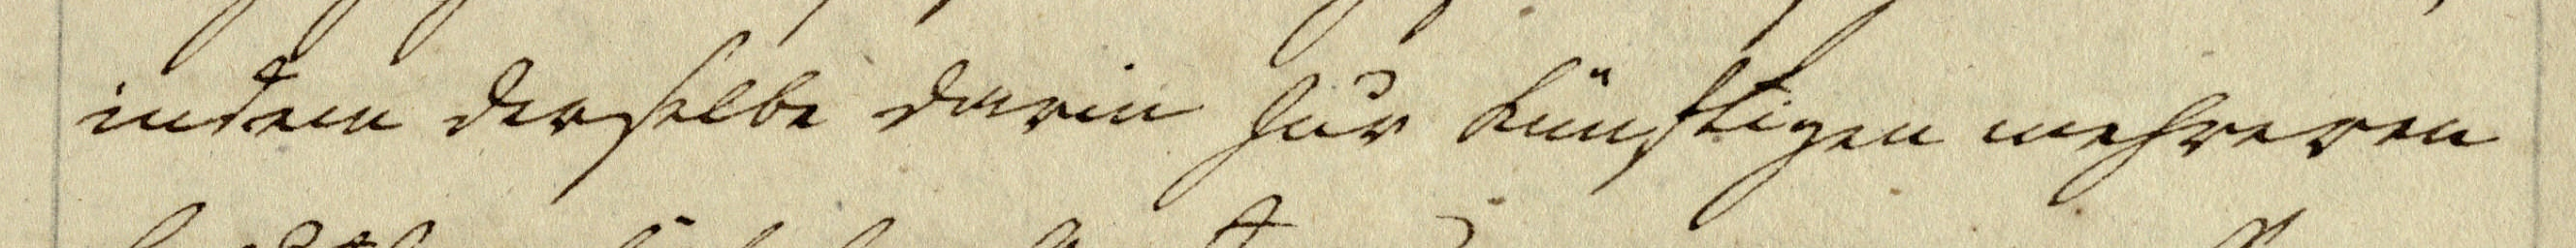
indem derselbe darin zur künftigen mehreren
